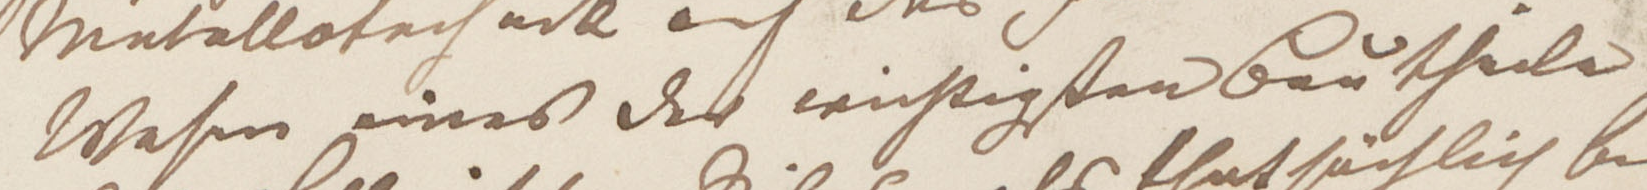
Wesen eines der wichtigsten Bautheile
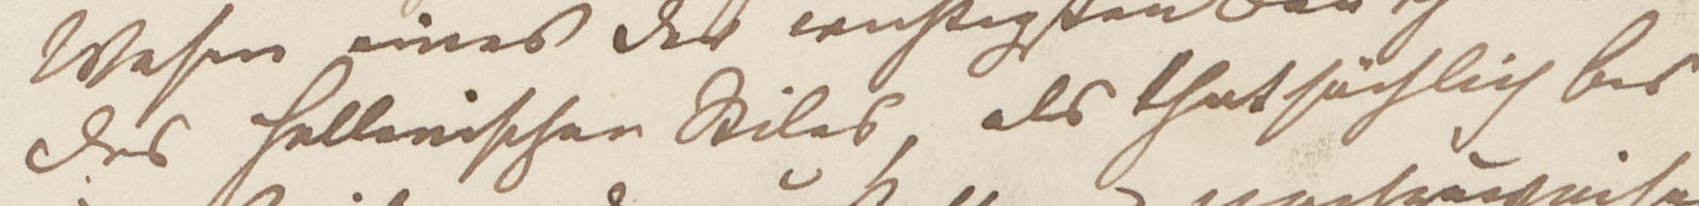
des Hellenischen Stiles, als thatsächlich bis
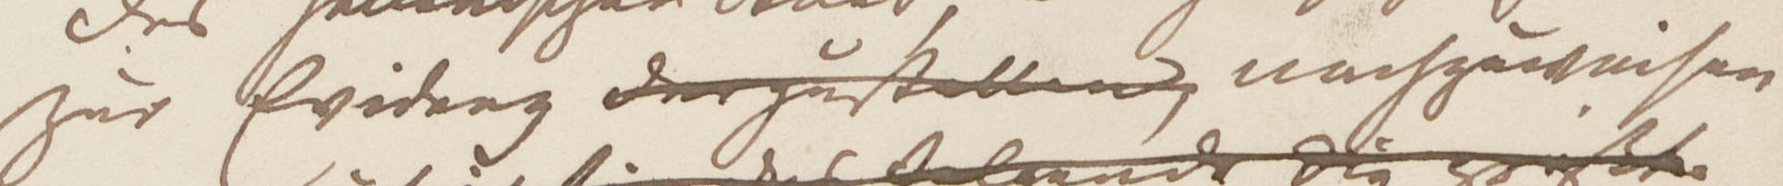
zur Evidenz darzustellen, nachzuweisen
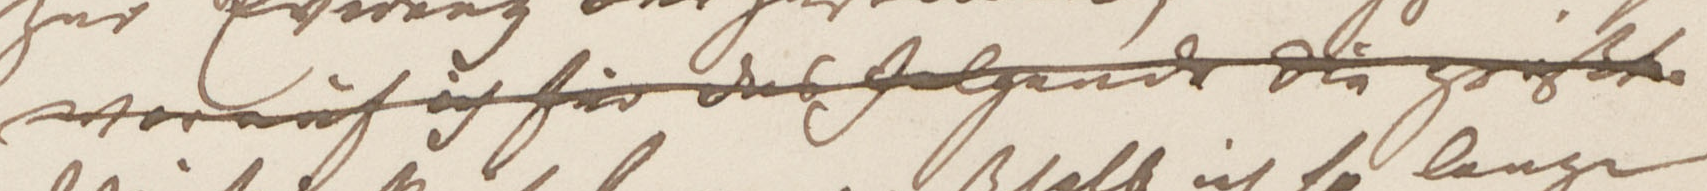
worauf ich für das Folgende die grösste
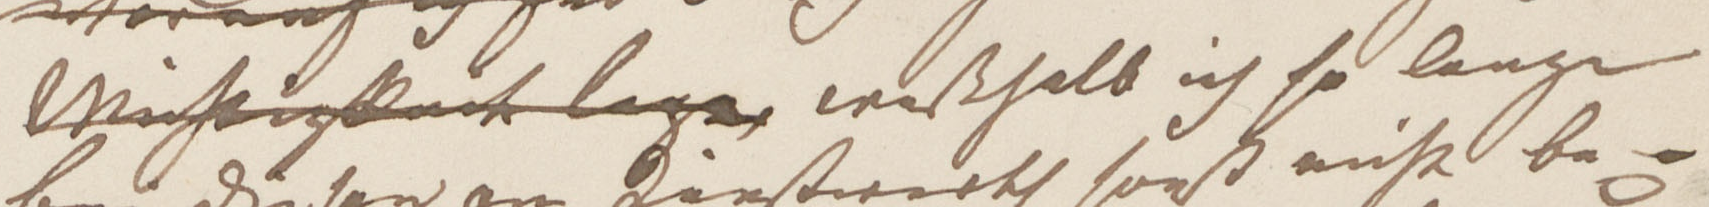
Wichtigkeit lege, wesshalb ich so lange
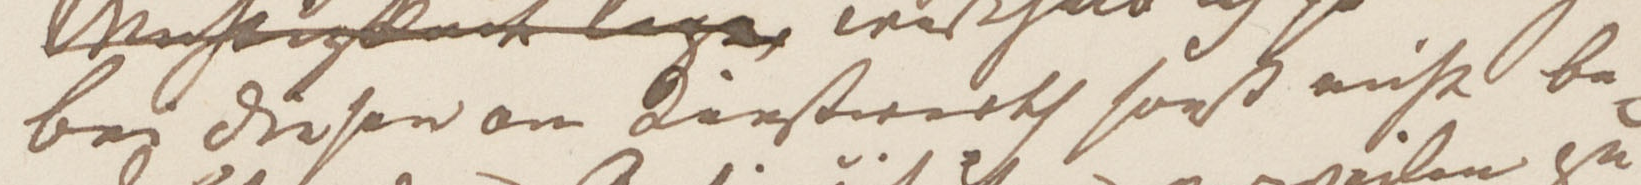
bei diesen an Kunstwerth sonst nicht be-
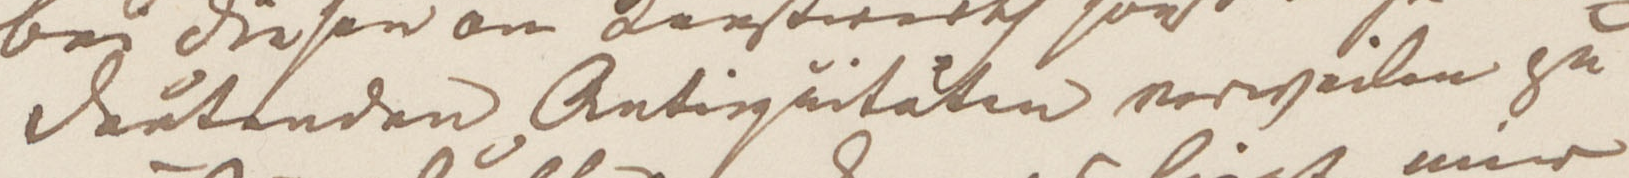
deutenden Antiquitäten verweilen zu
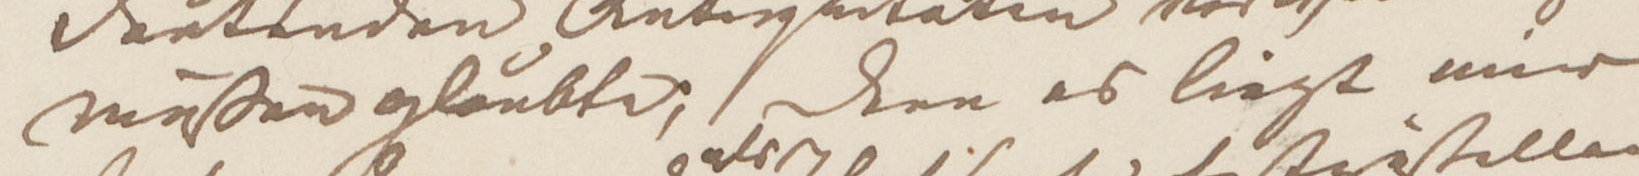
müssen glaubte; Denn es liegt mir
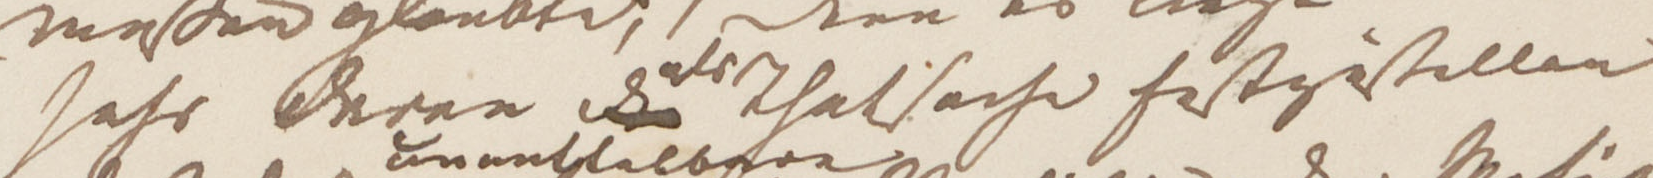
sehr daran die als Thatsache festzustellen
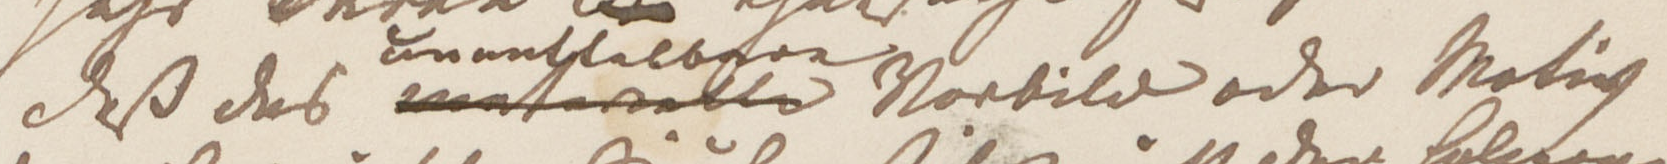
dass das materielle unmittelbare Vorbild oder Motiv
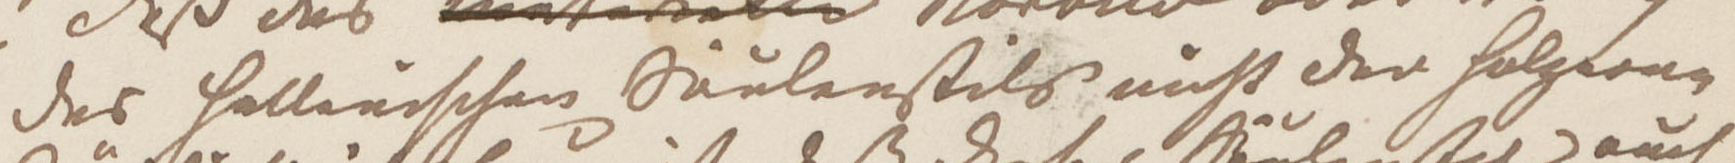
des Hellenischen Säulenstils nicht der holzerne
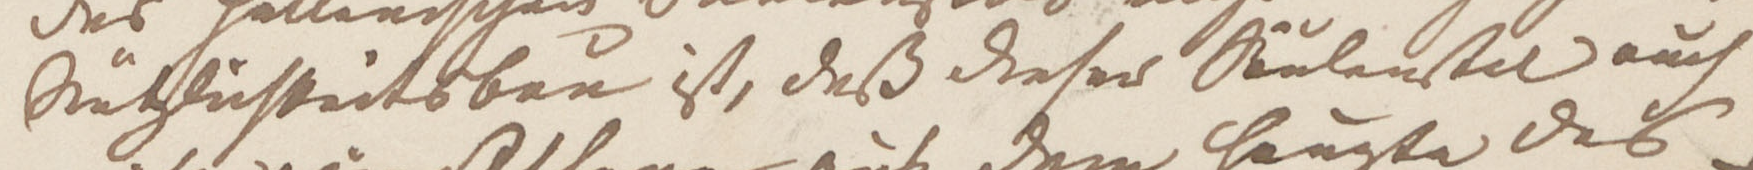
Nützlichkeitsbau ist, dass dieser Säulenstil auch
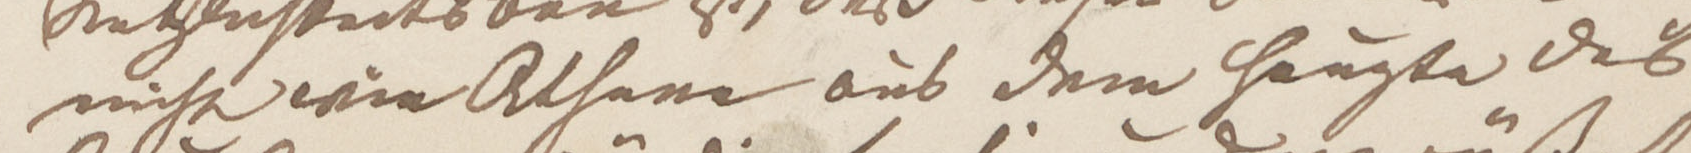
nicht wie Athene aus dem Haupte des
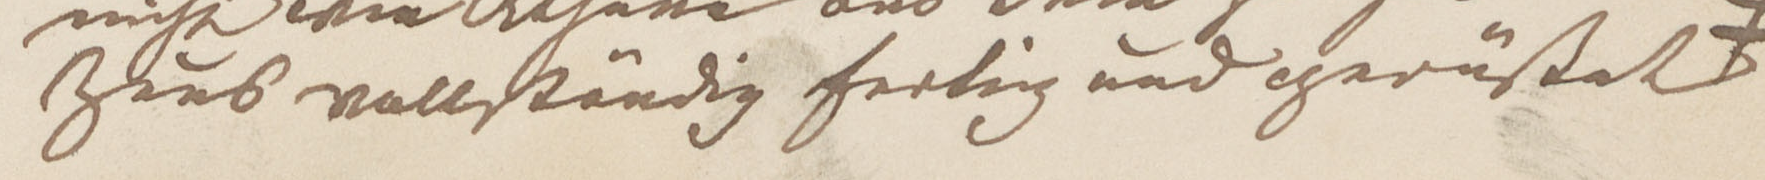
Zeus vollständig fertig und gerüstet %
